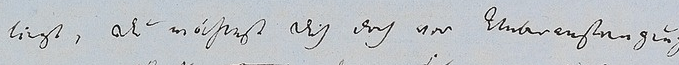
liegt, Du möchtest Dich doch vor Ueberanstrengungen
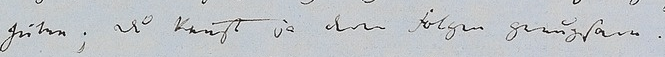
hüten; Du kennst ja deren Folgen genugsam.
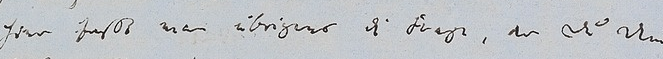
Hier faßt man übrigens die Frage, der Du Deine
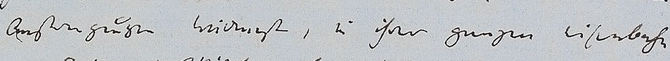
Anstrengungen widmest, in ihrer ganzen eisenbahn-
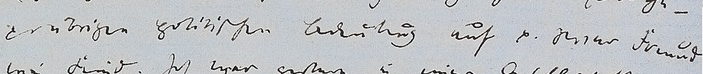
&. übrigen politischen Bedeutung auf &. zwar Freund
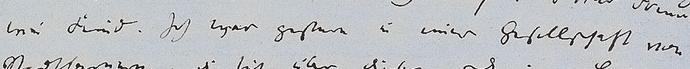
wie Feind. Ich war gestern in einer Gesellschaft von
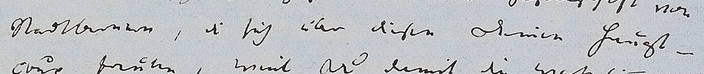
Stadtbernern, die sich über diesen Deinen Haupt-
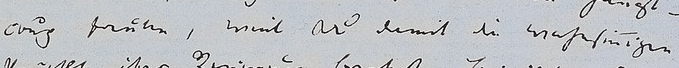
crux freuten, weil Du damit die wahnsinnigen
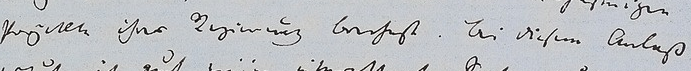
Projekte ihrer Regierung brechest. Bei diesem Anlaß
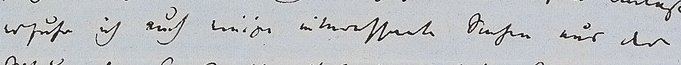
erfuhr ich auch einige interessante Sachen aus der
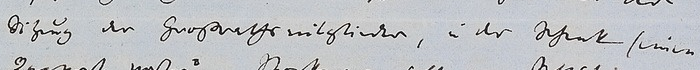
Sitzung der Großrathsmitglieder, in der Schenk seinen
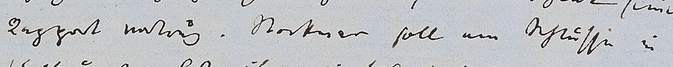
Rapport vortrug. Stockmar soll am Schlusse in
